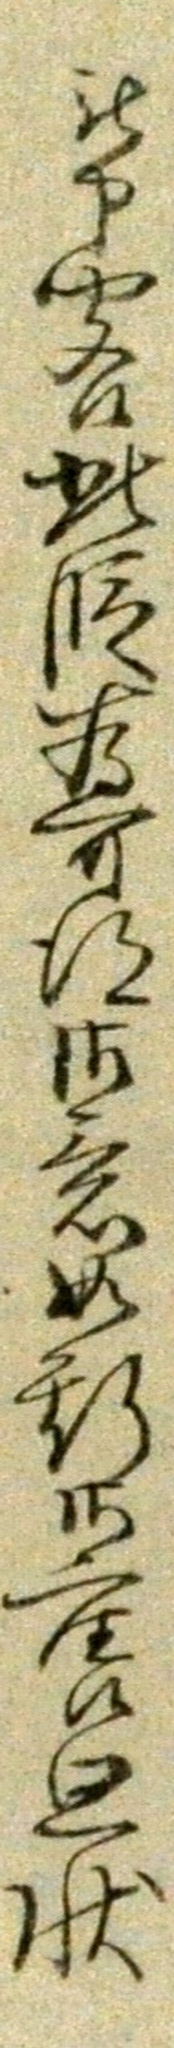被申聞候此段為可得御意如斯御座候廻状
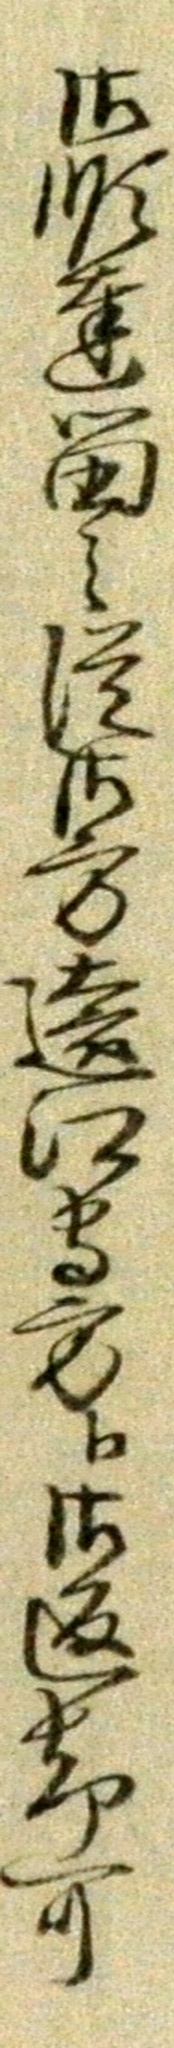御順達留之従御方遠江守方え御返却可
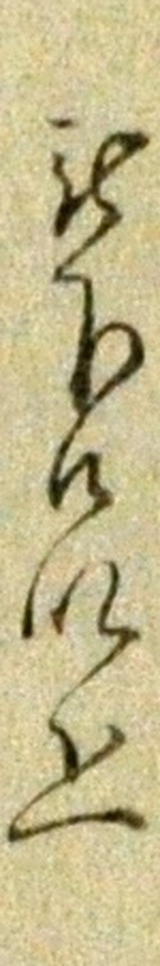被下候以上
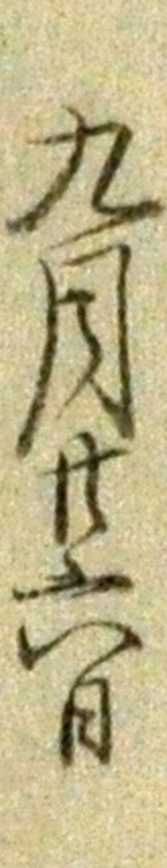九月廿六日
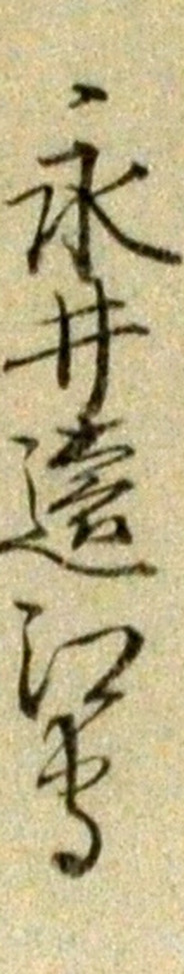永井肥前守
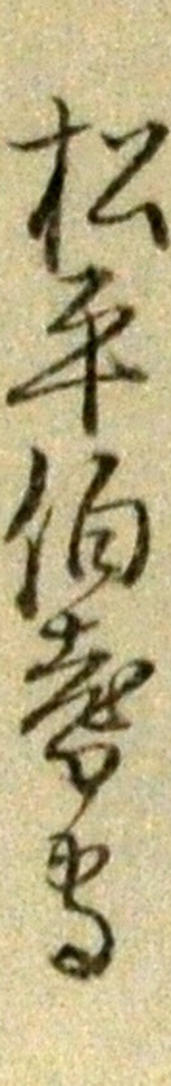松平伯耆守
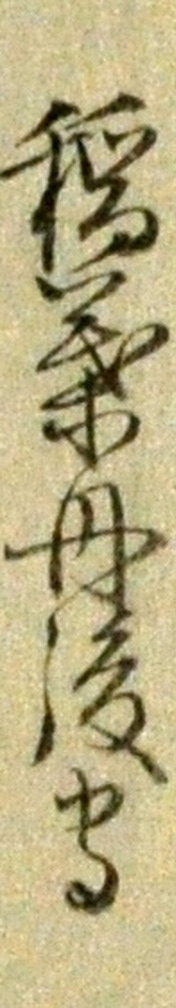稲葉丹後守
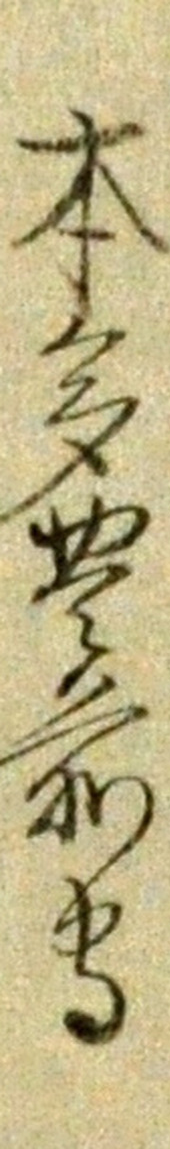本多豊前守
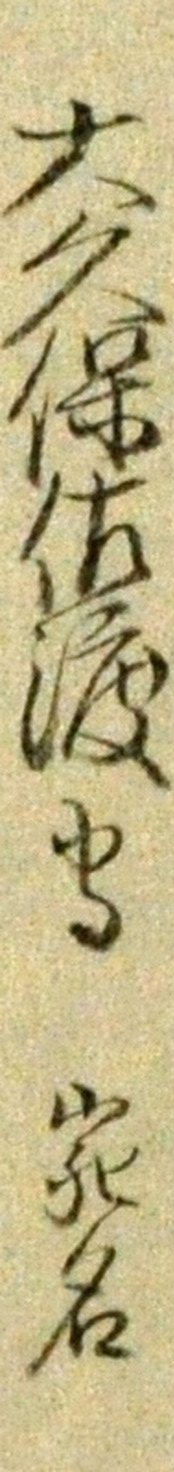大久保佐渡守宛名
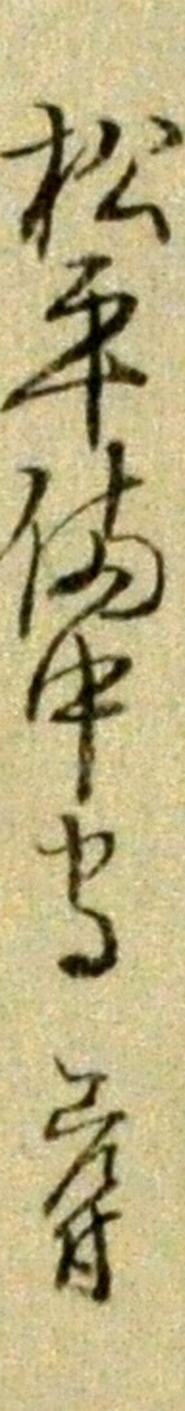松平備中守差付
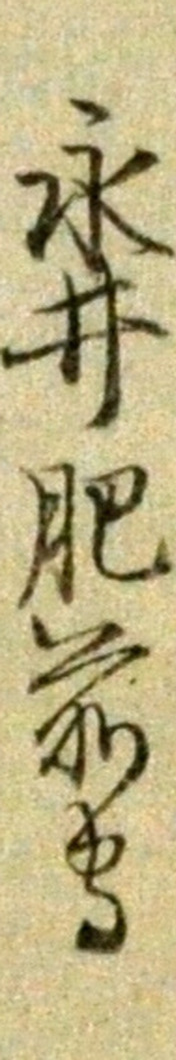永井肥前守
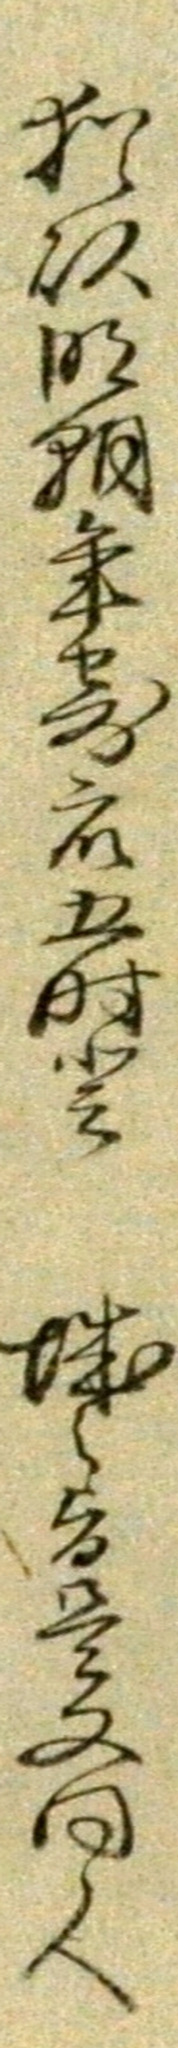猶以明朝年寄衆五時登城之旨是又同人
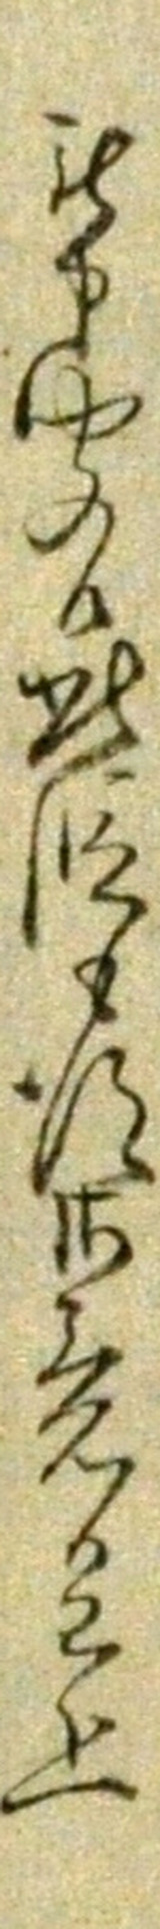被申聞候此段も得御意候已上
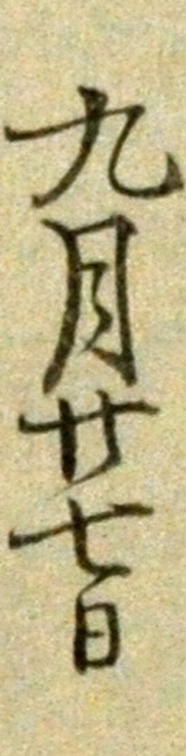九月廿六日
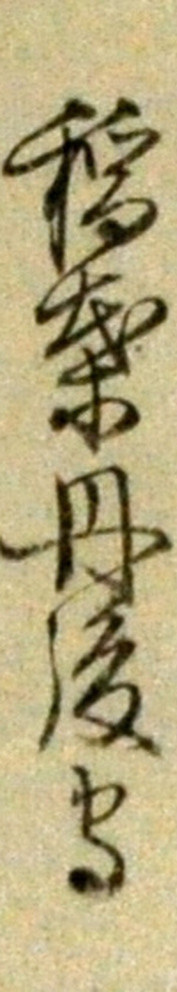稲葉丹後守

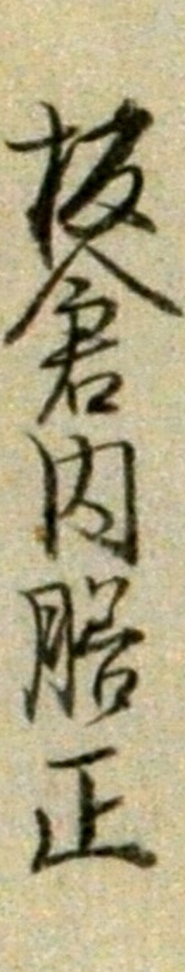板倉内膳正
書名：諸留書〔一括〕
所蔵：伊那市立高遠町図書館・合同会社AMANE
